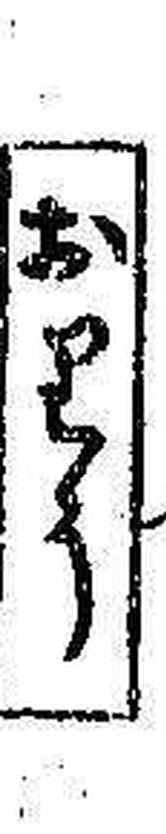おりう
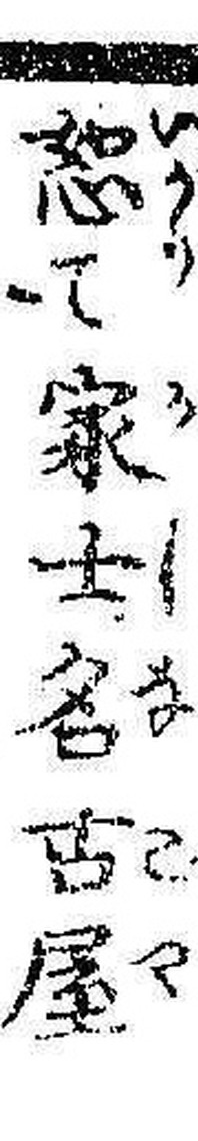怒て家士名古屋
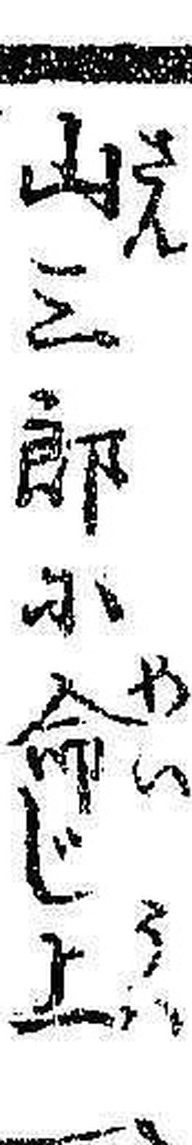山三郎に命じ上
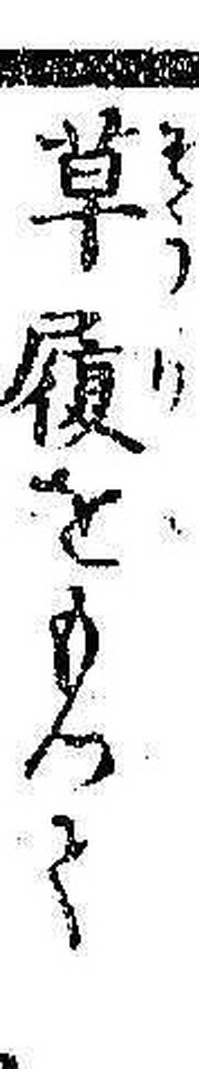草履をもつて
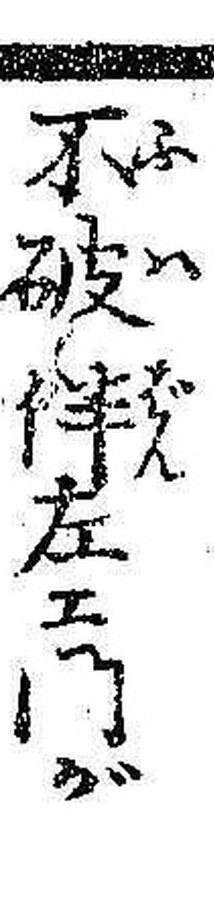不破伴左エ門が
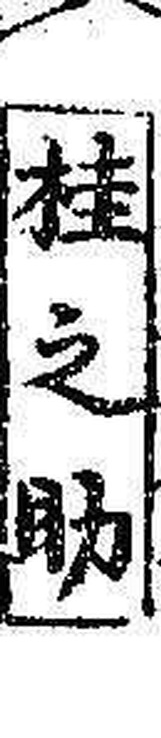桂之助
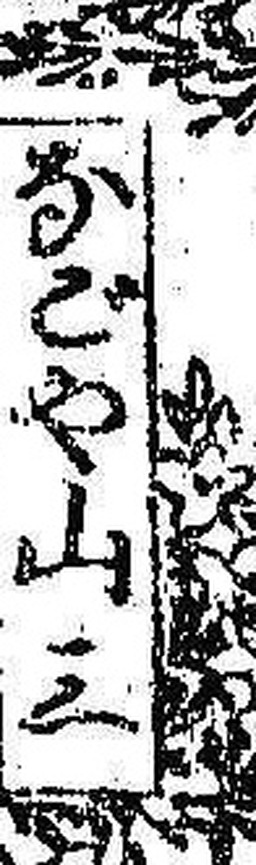なごや山三
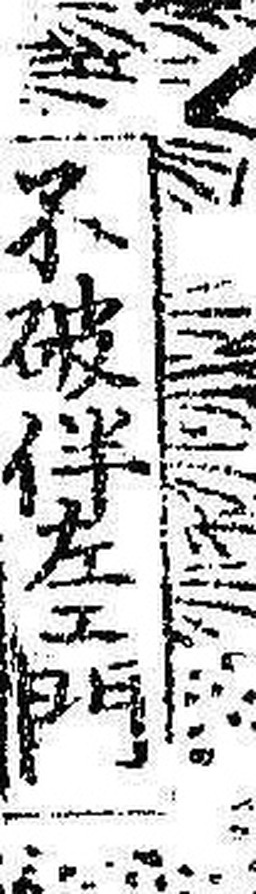不破伴左エ門

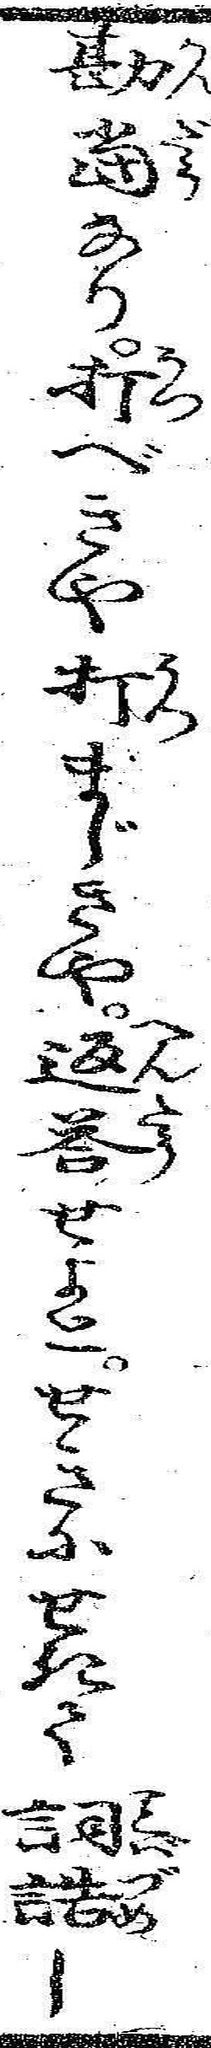勘当なり。打べきや打まじきや。返答せよと。せきにせきて詞詰し
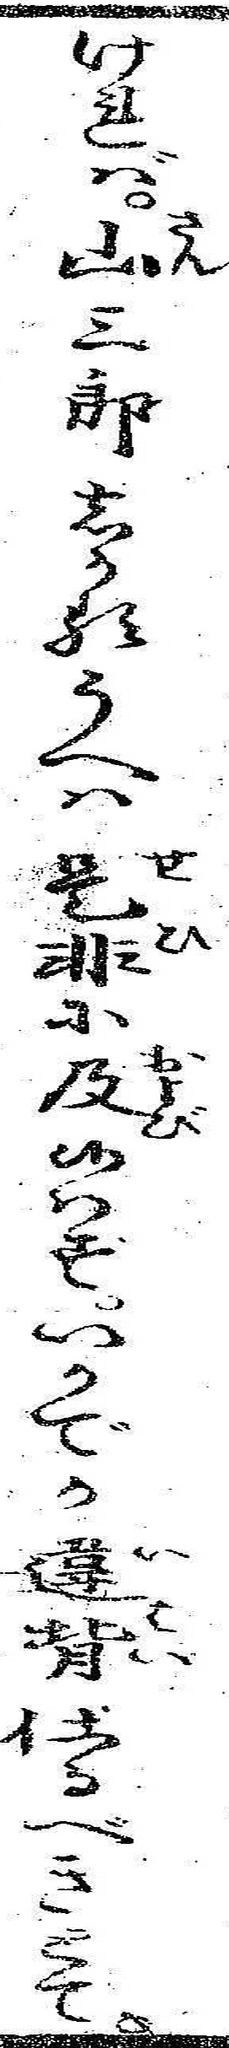ければ。山三郎しかるうへは是非に及候はず。いかでか違背仕るべきとて。
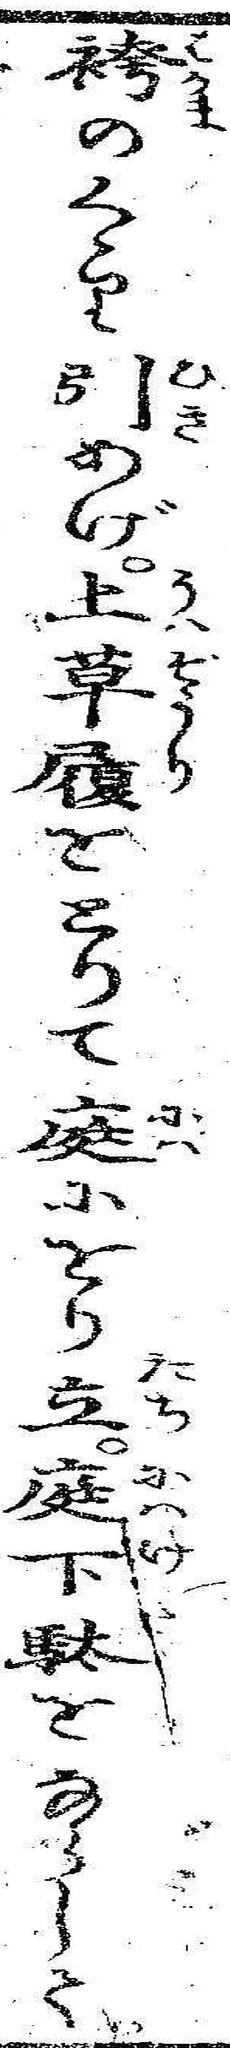袴のくゝり引あげ。上草履をとりて庭にをり立。庭下駄をならして。
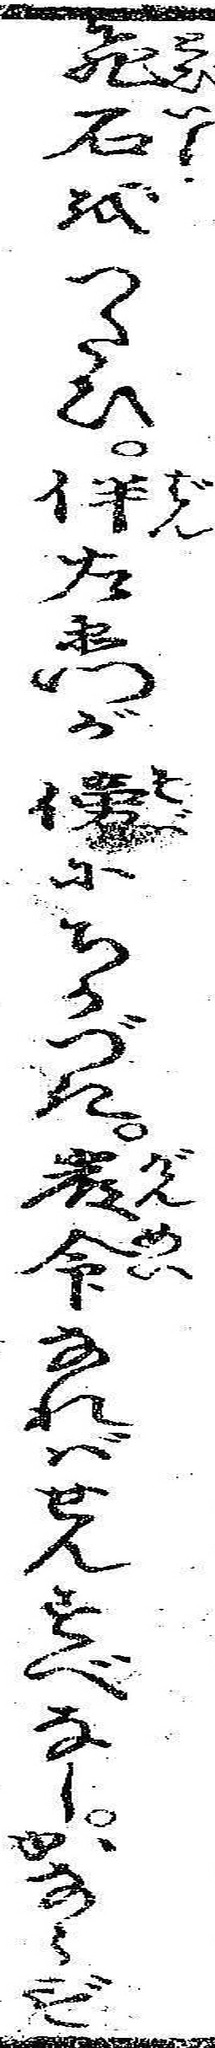飛石をつたひ。伴左衛門が傍にちかづき。厳命なればせんすべなし。かならず
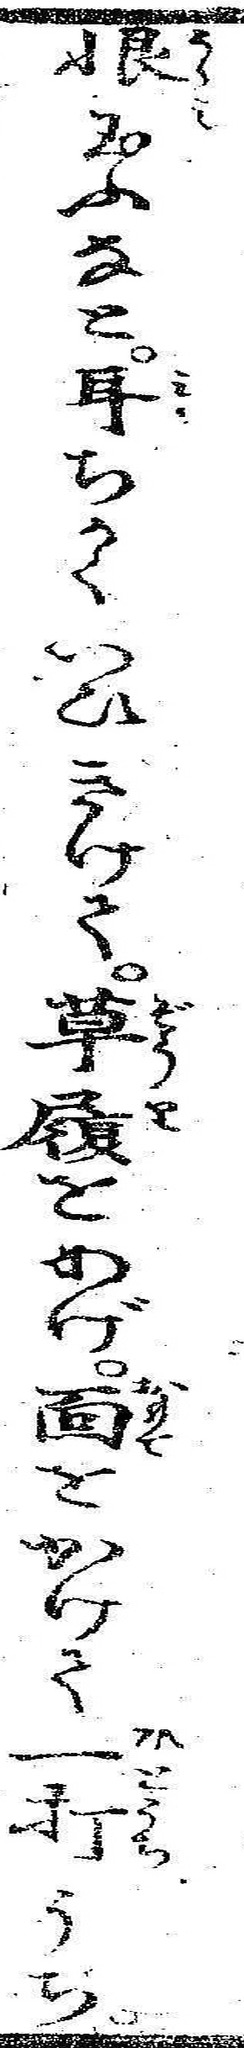恨玉ふなと。耳ちかくいひきけて。草履をあげ。面をかけて一打うち。
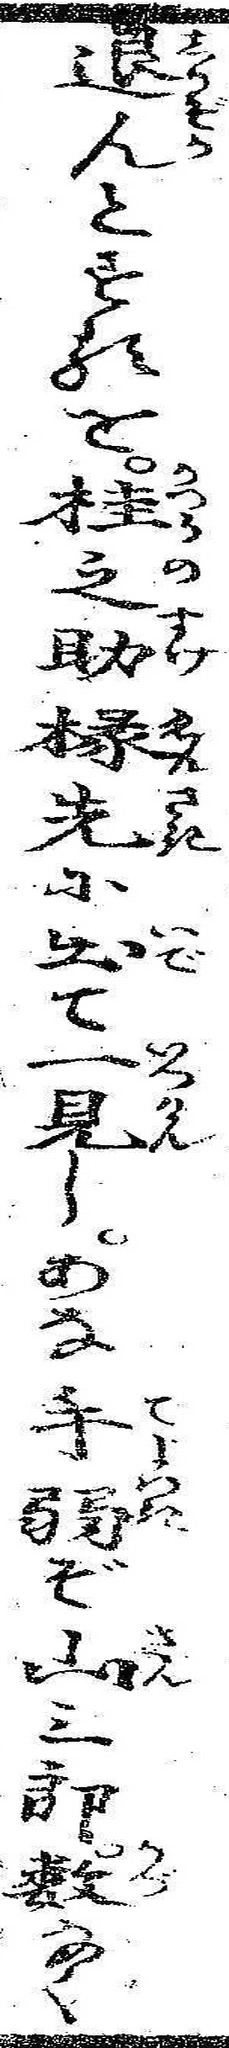退んとするを。桂之助椽先に出て一見し。あな手弱ぞ山三郎。数なく
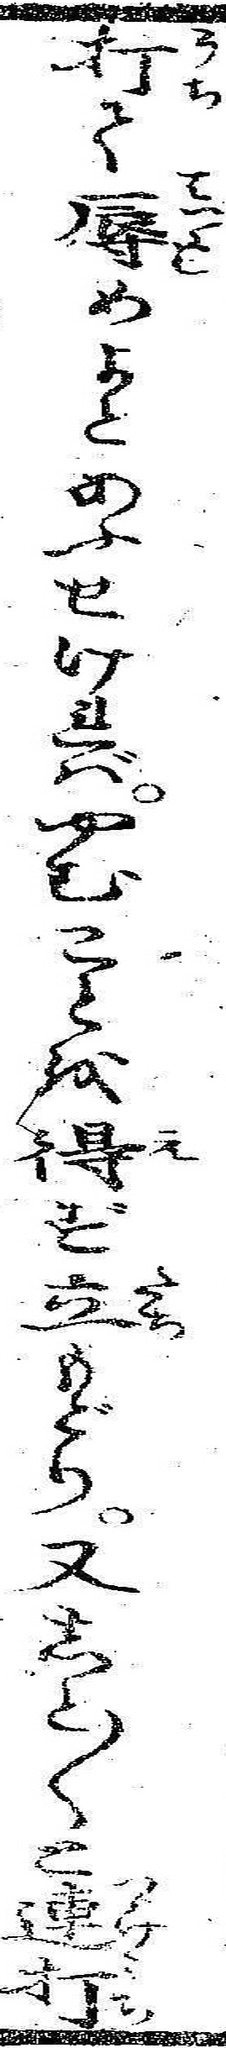打て辱めよとあふせければ。やむことを得ず立もどり。又しと〳〵と連打
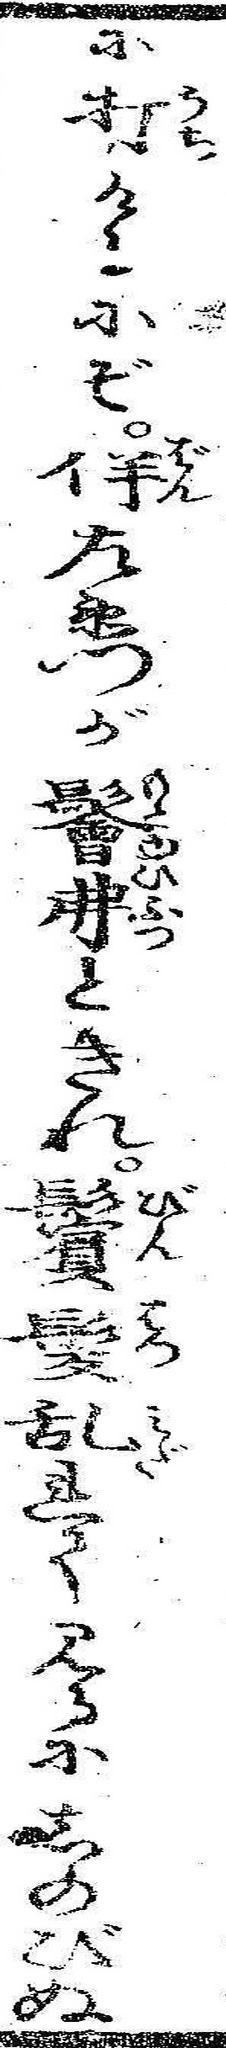に打けるにぞ。伴左衛門が鬠弗ときれ。鬢髪乱れて見るにしのびぬ
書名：昔話稲妻表紙
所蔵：国文学研究資料館
